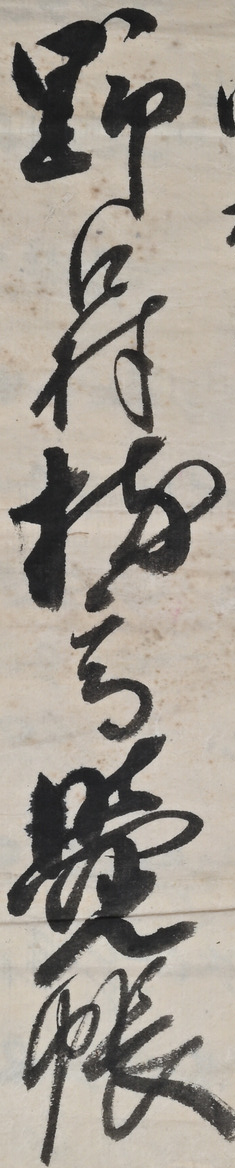野口村持高覚帳
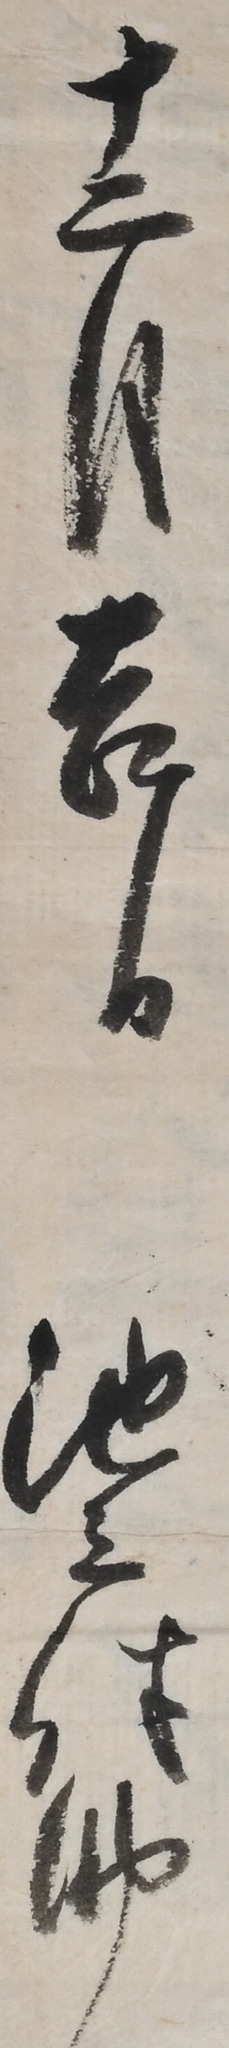十二月吉日池上伴助

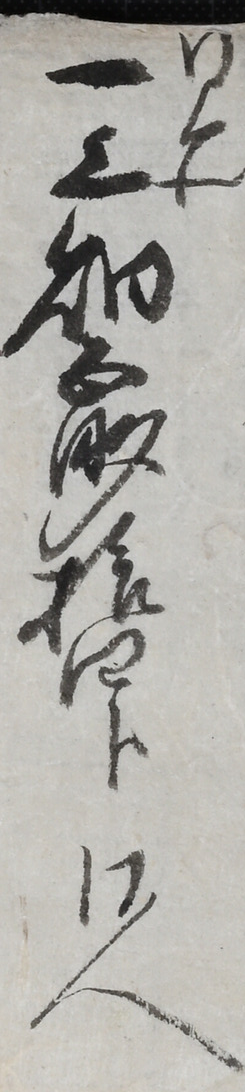一上畑五畝拾四歩同人
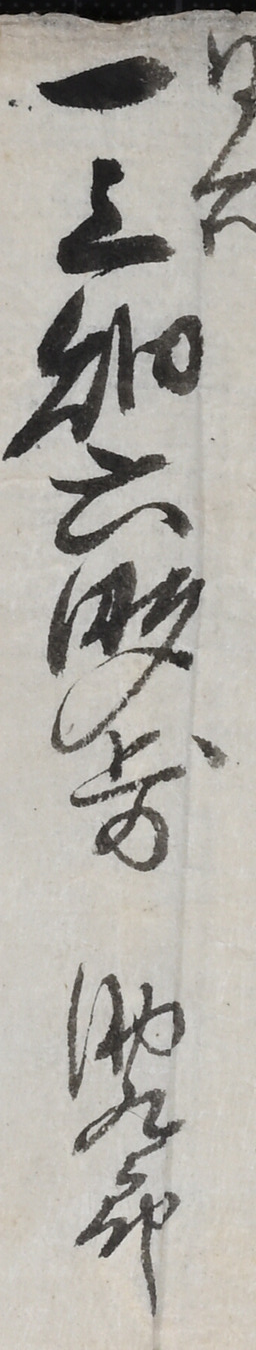一上畑六畝歩助九郎
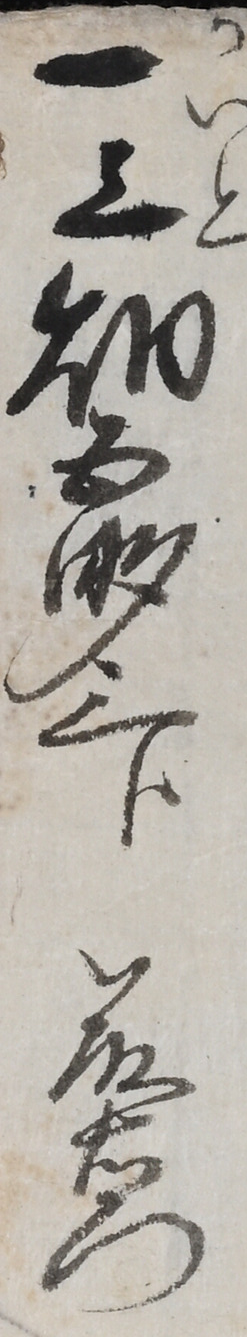一上畑五畝三歩藤右衛門
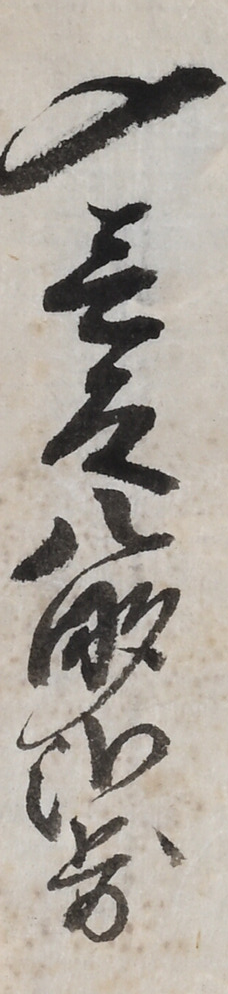〆壱反八畝弐歩
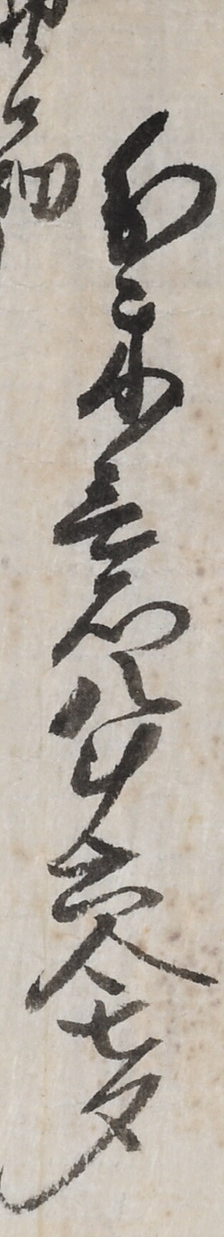分米壱石八斗六合七夕
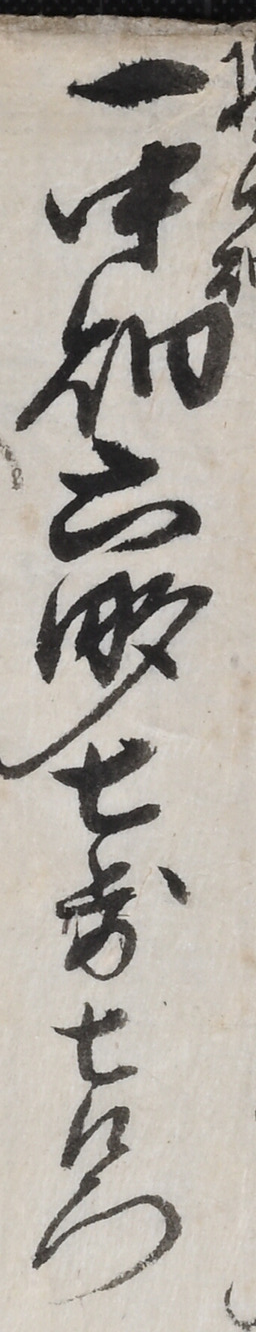一中畑六畝拾七歩七左衛門
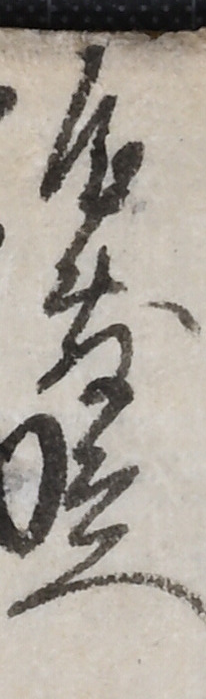屋敷壱人
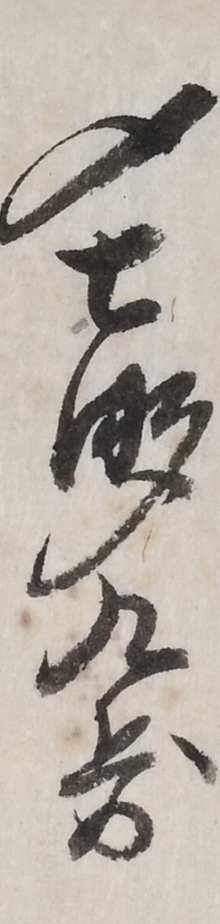〆七畝九歩
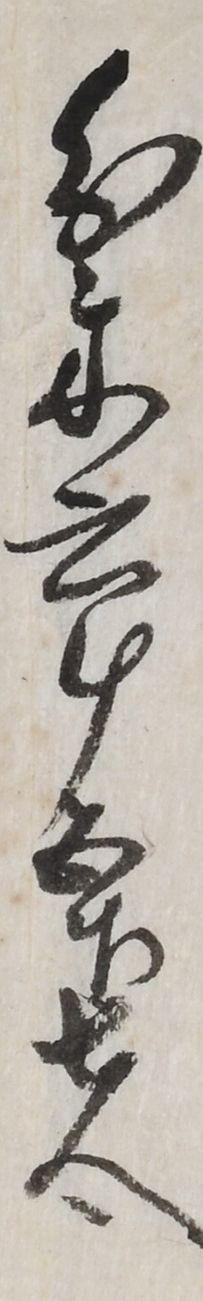分米六斗五五升七合
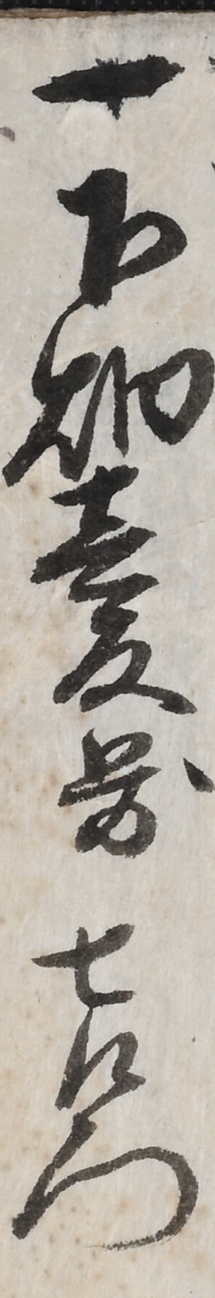一下畑壱反歩七左衛門
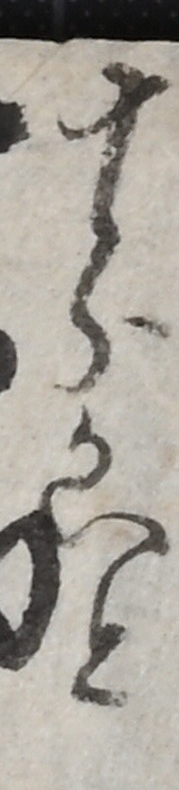十ゐかいと
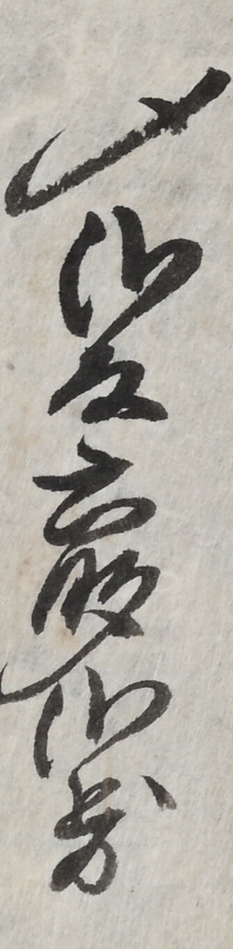〆壱反八畝弐歩
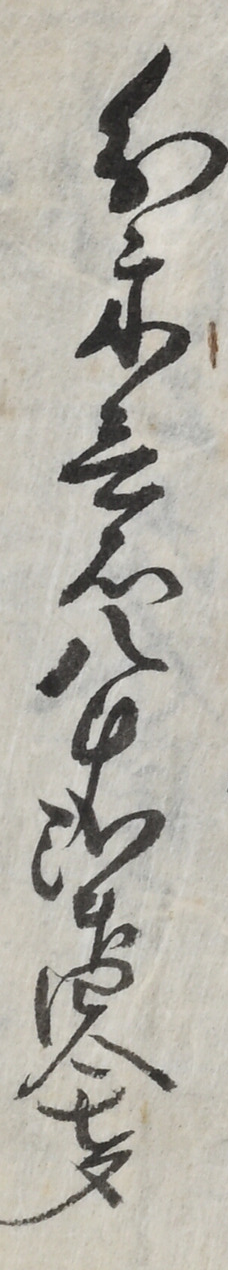分米壱石八斗六合七夕

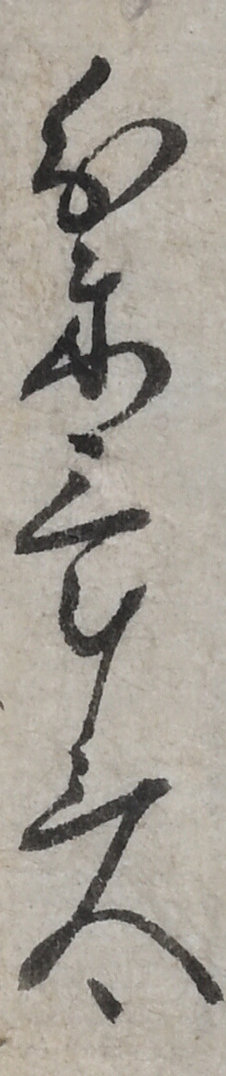分米三斗三合
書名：野口村持高覺帳
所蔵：伊那市立高遠町図書館・合同会社AMANE
